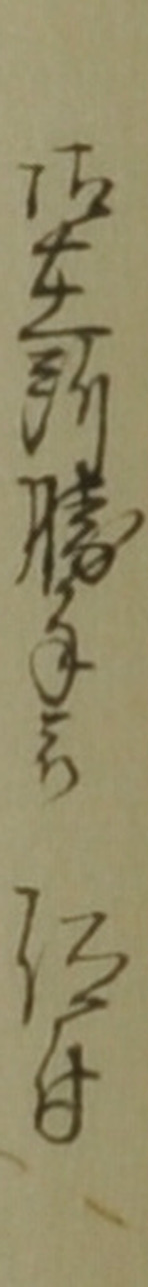御在所勝手被仰付
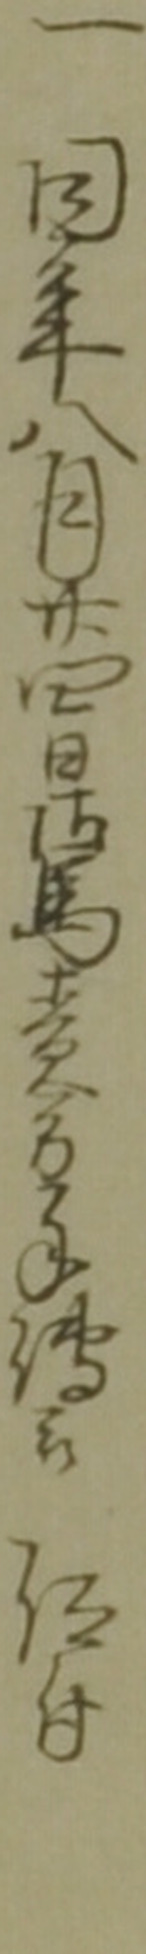一同年八月廿四日御馬責方手伝被仰付
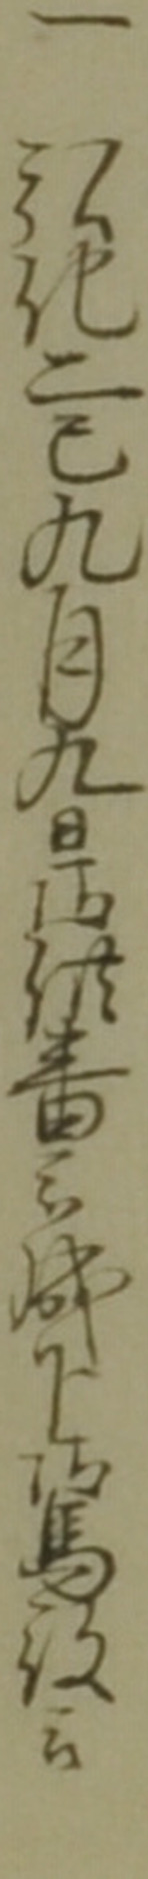一弘化二巳九月九日御供番被成下御馬役被
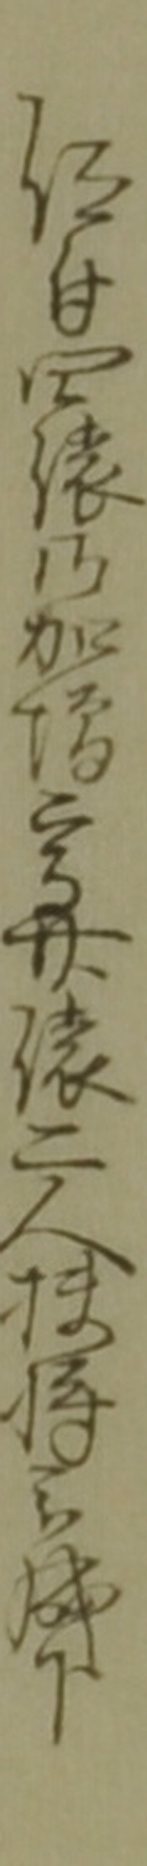仰付四俵御加増高廿俵二人扶持被成下

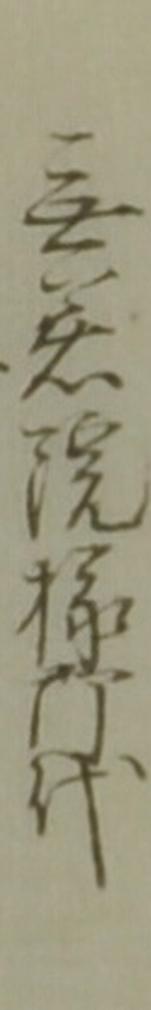無着院様御代
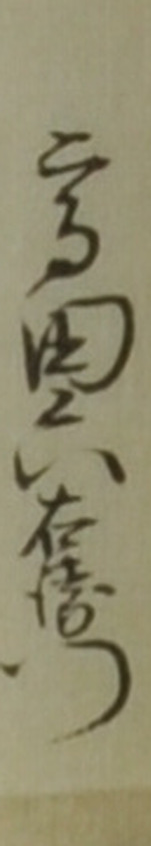高田六右衛門
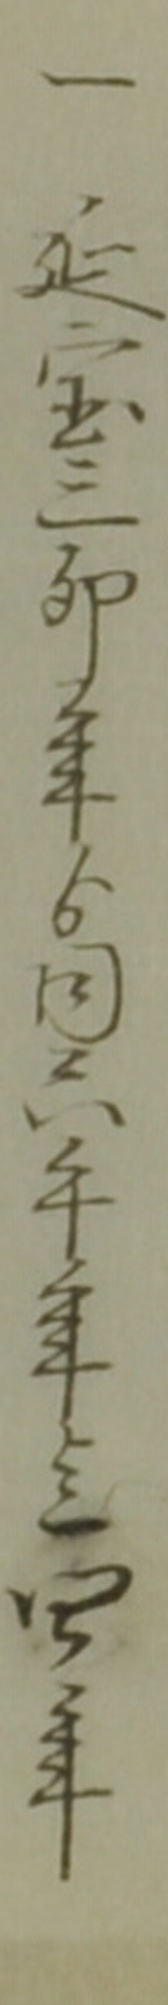一延宝三卯年ゟ同六午年迄四年

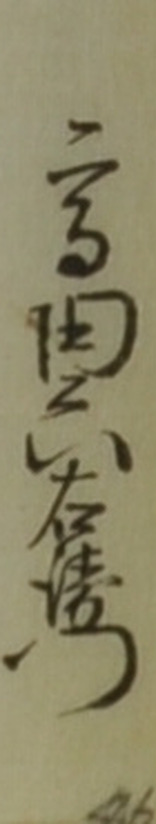高田六右衛門
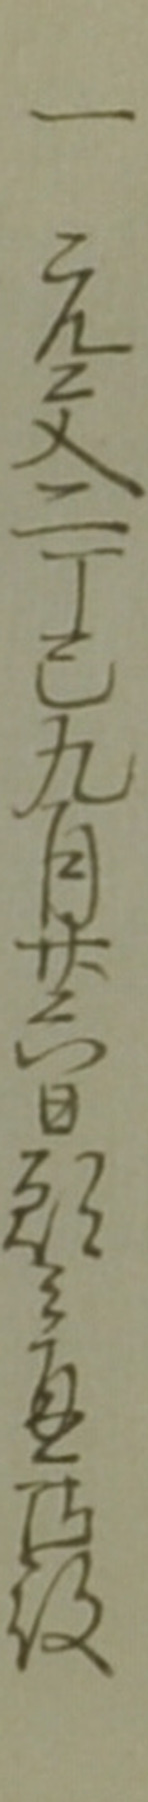一元文二丁未九月廿六日願之通御役
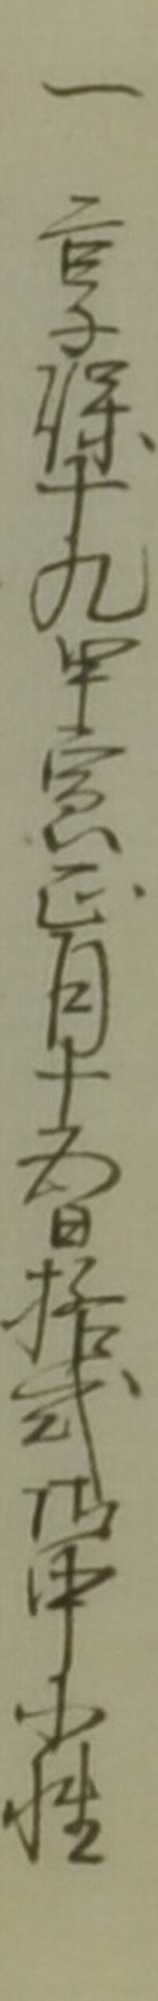一享保十九甲寅正月十五日格式御中小性
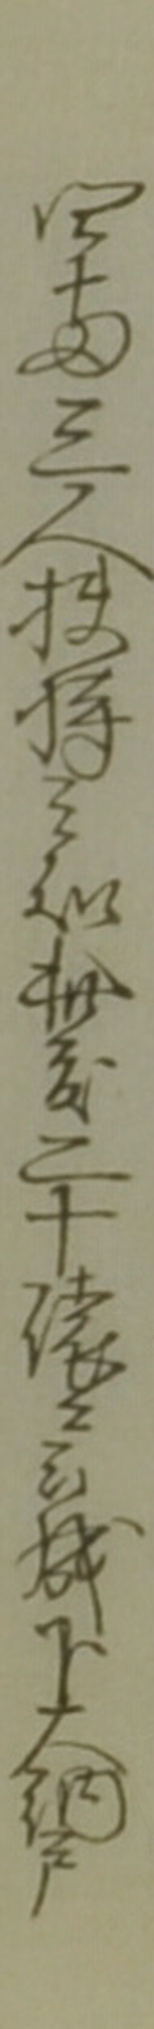四両三人扶持之処此度二十俵二被成下大納戸
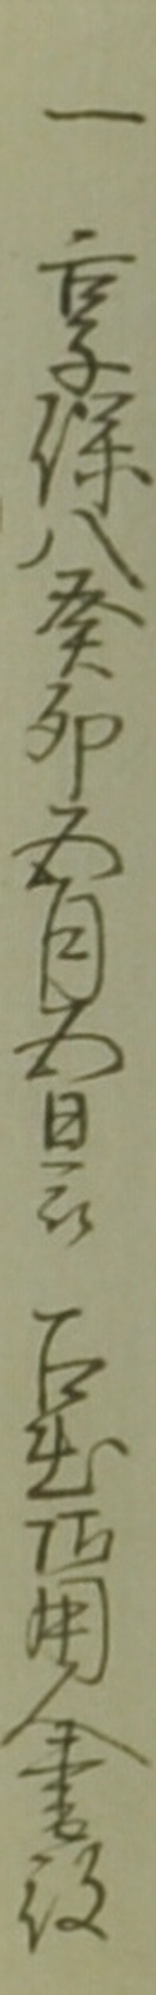一享保八癸卯五月五日被召出御用人書役
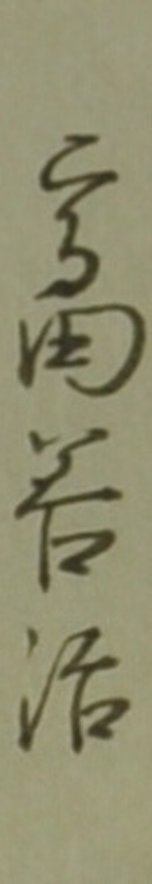高田善治
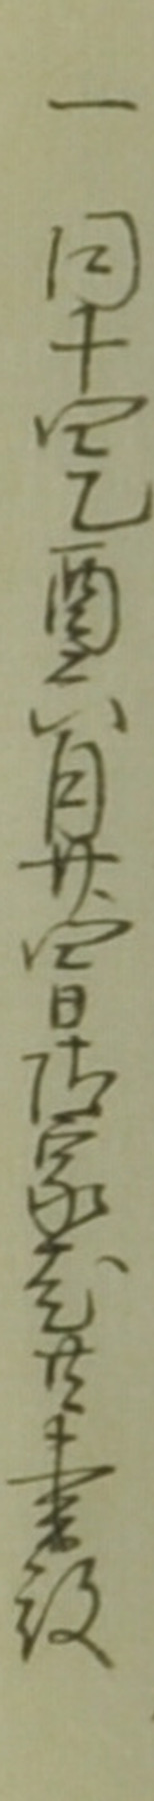一同十四乙酉六月廿四日御家老共書役

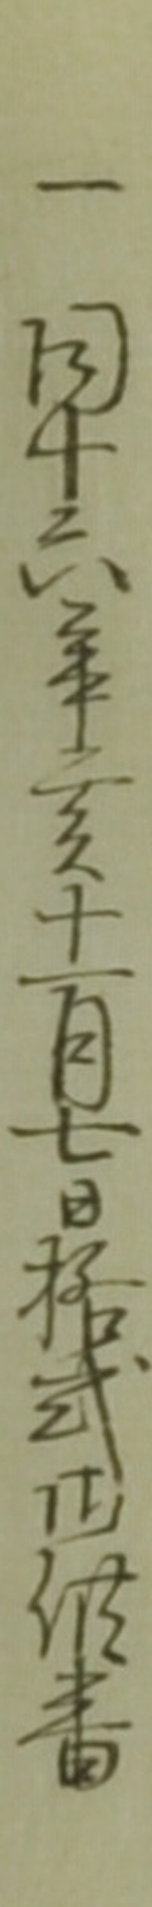一同十六辛亥十一月七日格式御供番
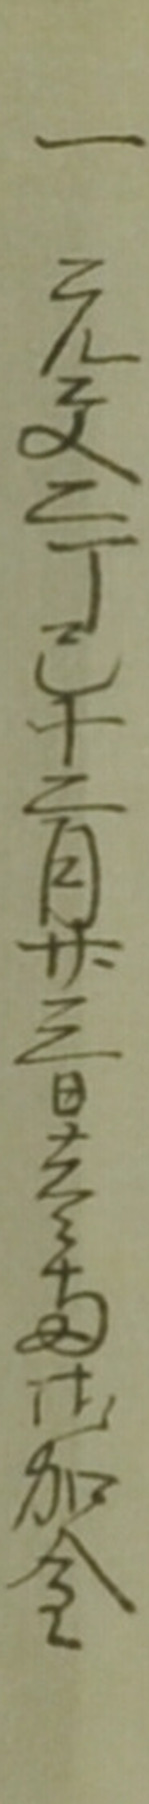一元文二丁巳十二月廿三日壱両御加金
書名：無足諸士勤仕録（一）
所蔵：伊那市立高遠町図書館・合同会社AMANE
